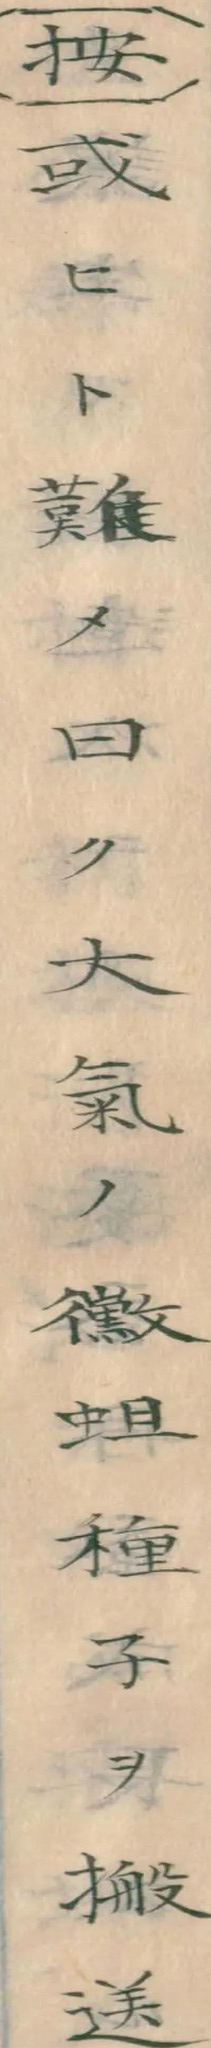[按]或ヒト難シテ曰ク大気ノ黴蛆種子ヲ搬送
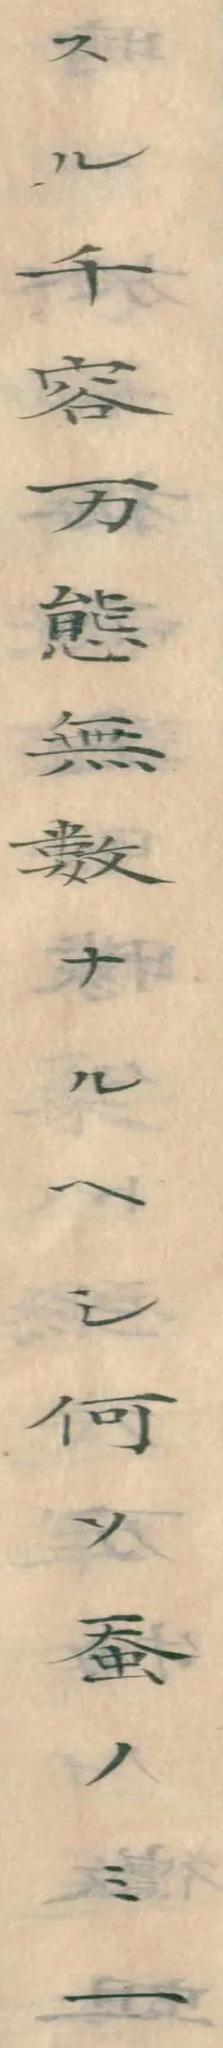スル千容万態無数ナルヘシ何ソ蚕ノミ一
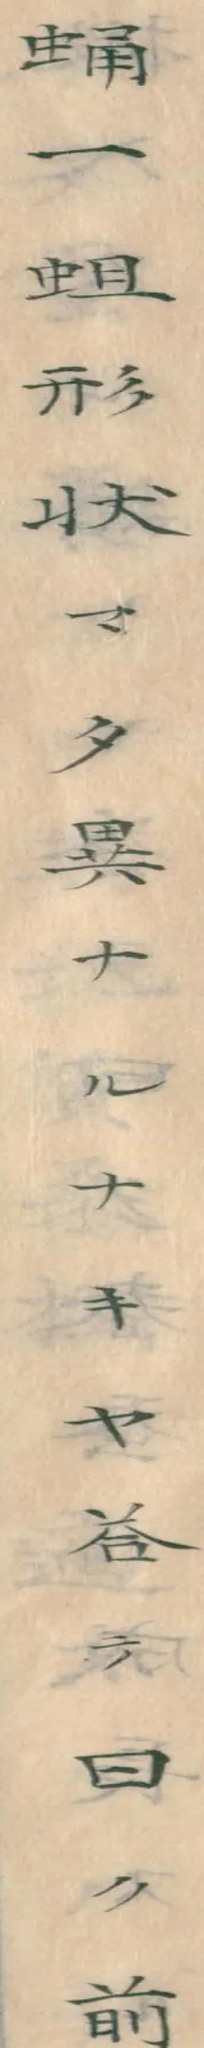蛹一蛆形状マタ異ナルナキヤ答テ曰ク前
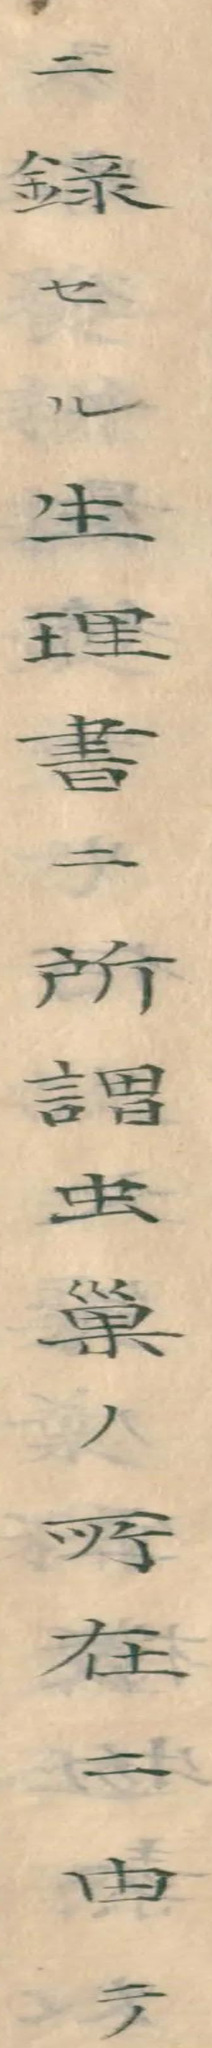ニ録セル生理書ニ所謂虫巣ノ所在ニ由テ
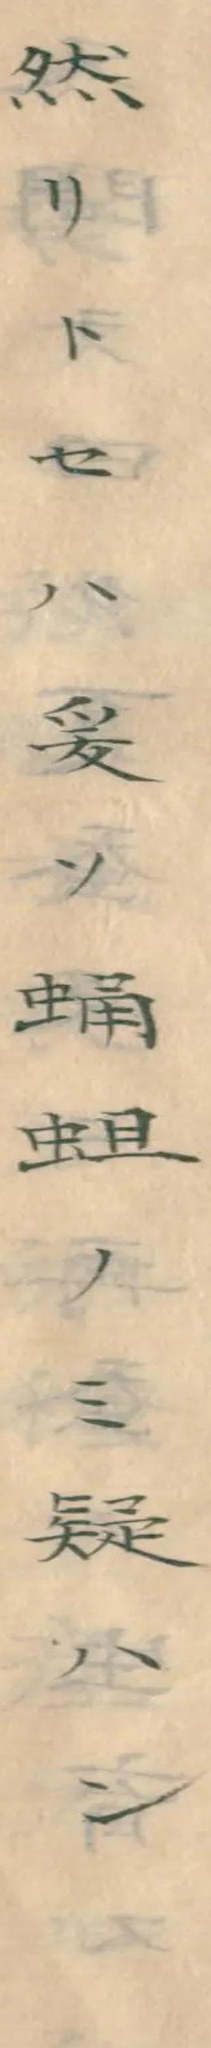然リトセハ爰ソ蛹蛆ノミ疑ハン

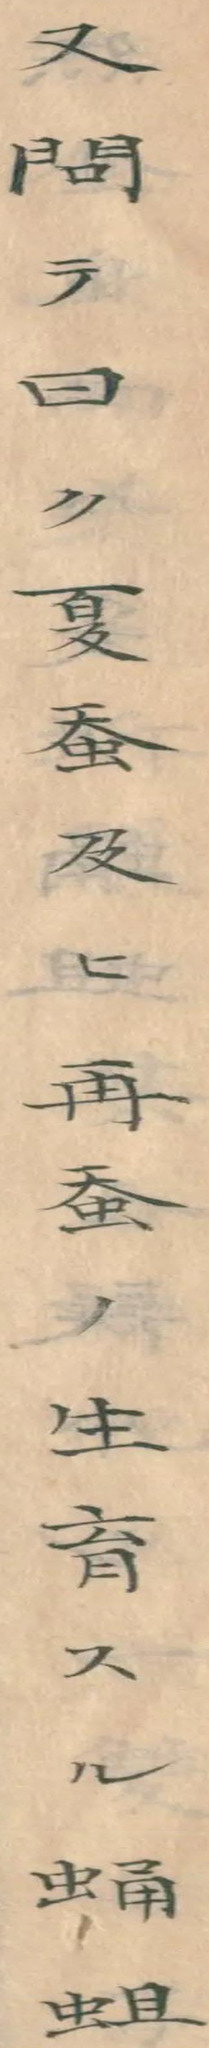又問テ曰ク夏蚕及ヒ再蚕ノ生育スル蛹蛆
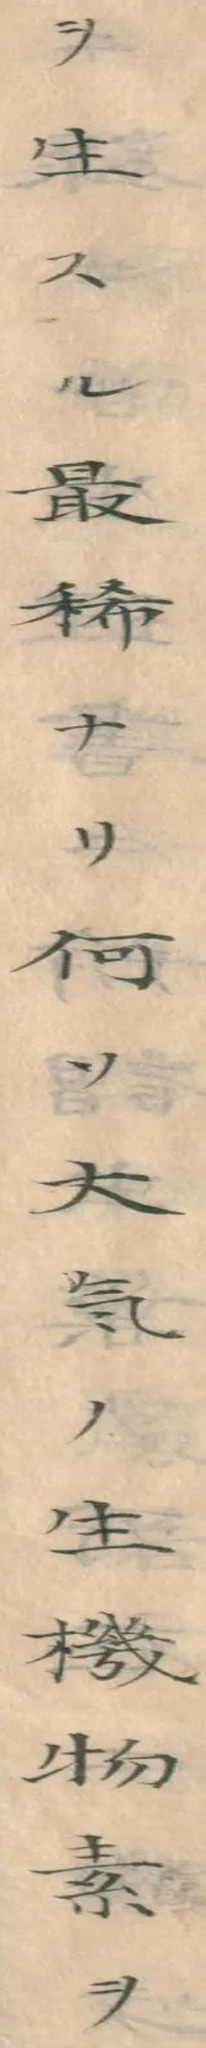ヲ生スル最稀ナリ何ソ大気ノ生機物素ヲ
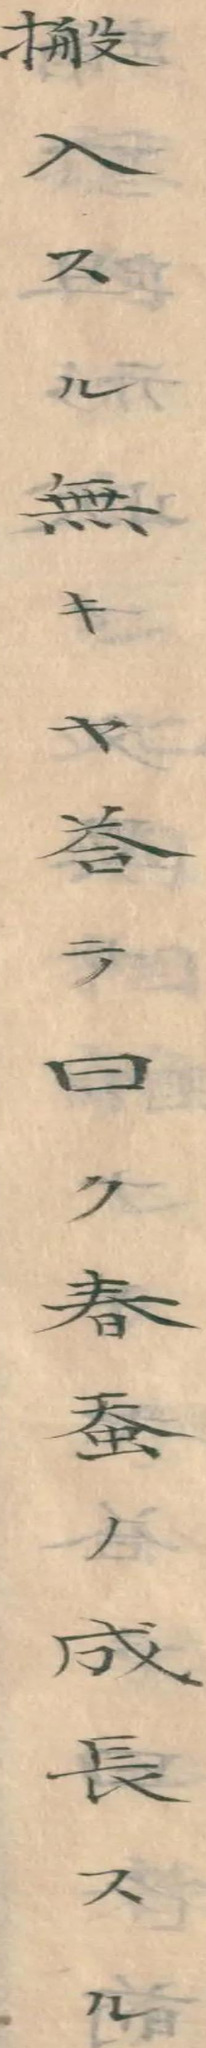搬入スル無キヤ答テ曰ク春蚕ノ成長スル
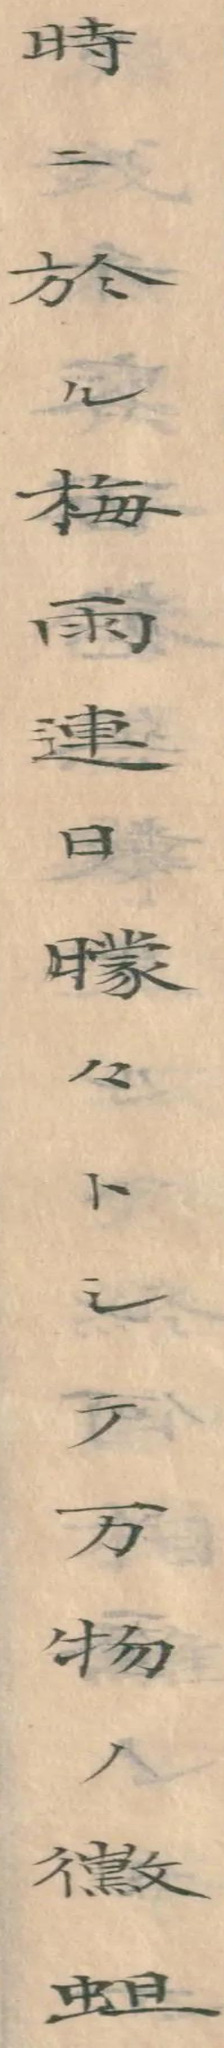時ニ於ル梅雨連日朦々トシテ万物ノ黴蛆
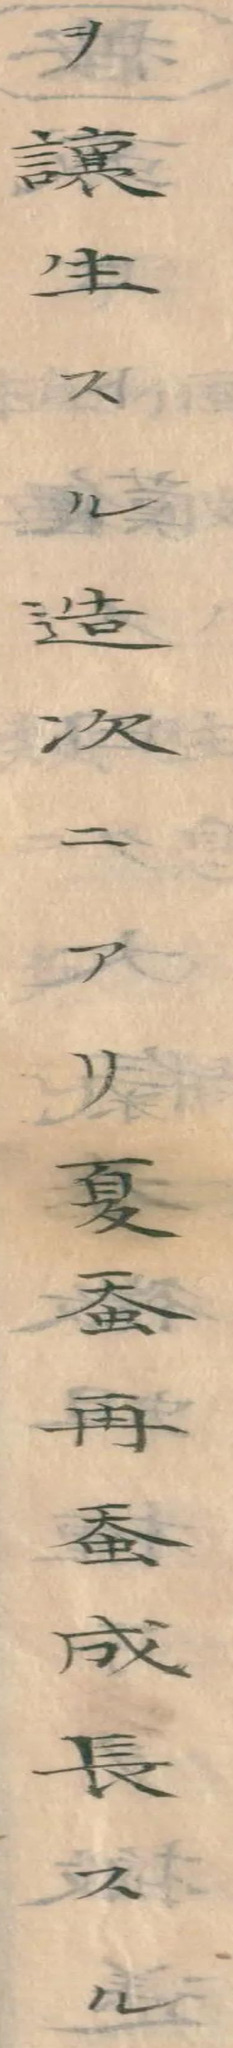ヲ譲生スル造次ニアリ夏蚕再蚕成長スル
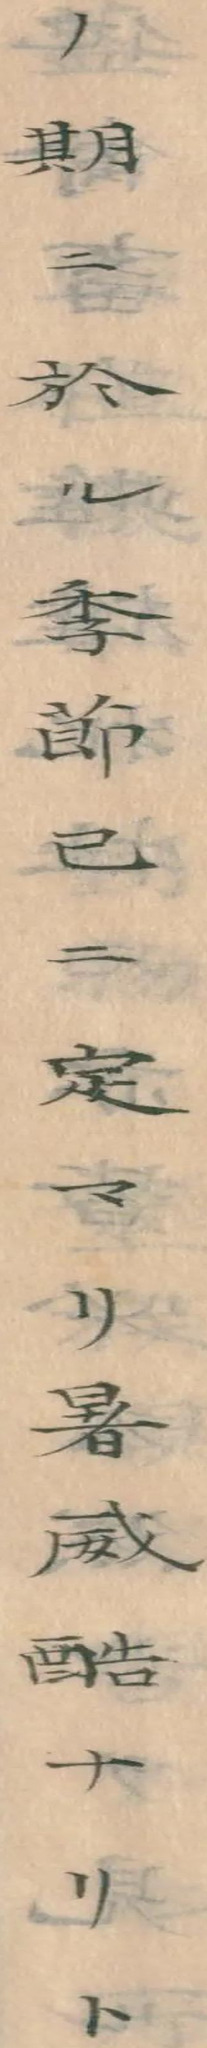ノ期ニ於ル季節已ニ定マリ暑威酷ナリト
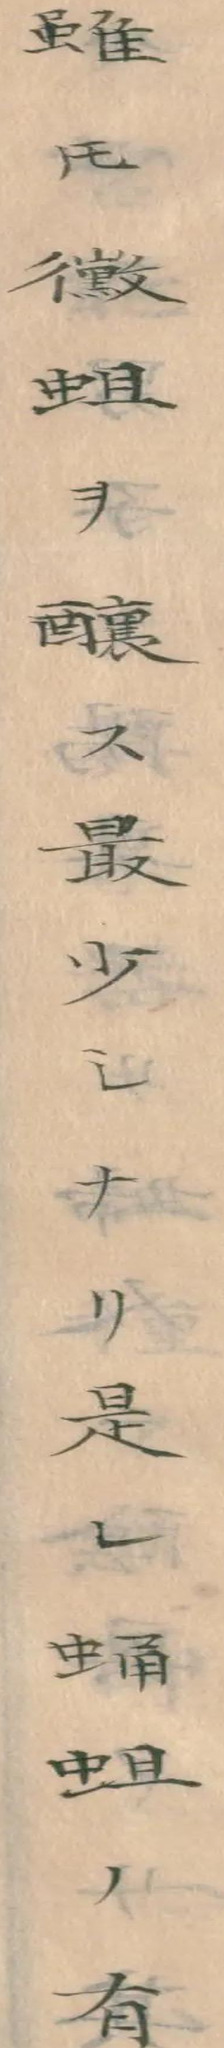雖トモ黴蛆ヲ醸ス最少シナリ是レ蛹蛆ノ有
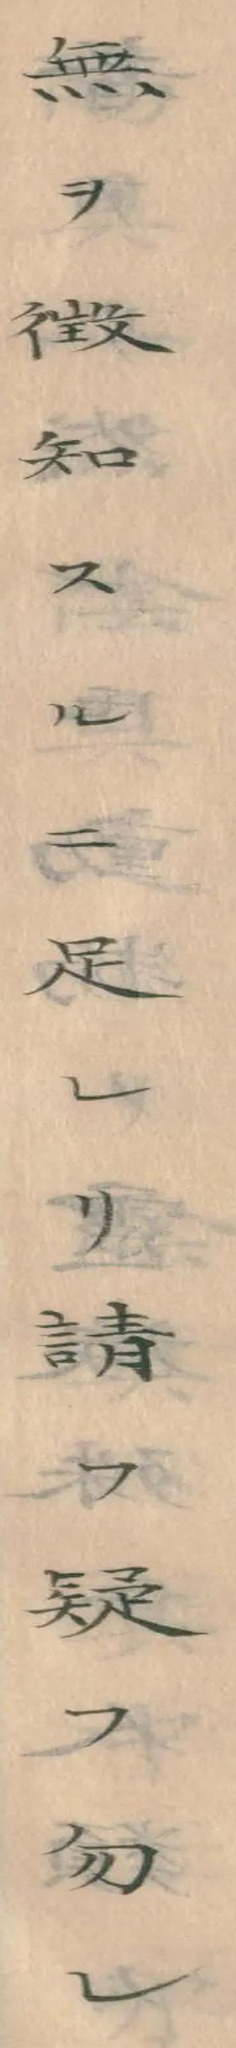無ヲ徴知スルニ足レリ請フ疑フ勿レ
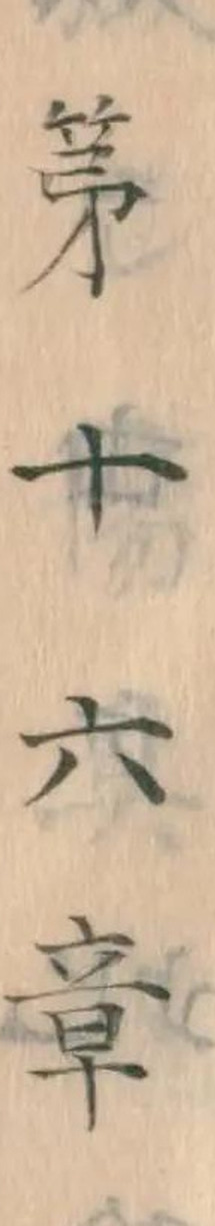第十六章
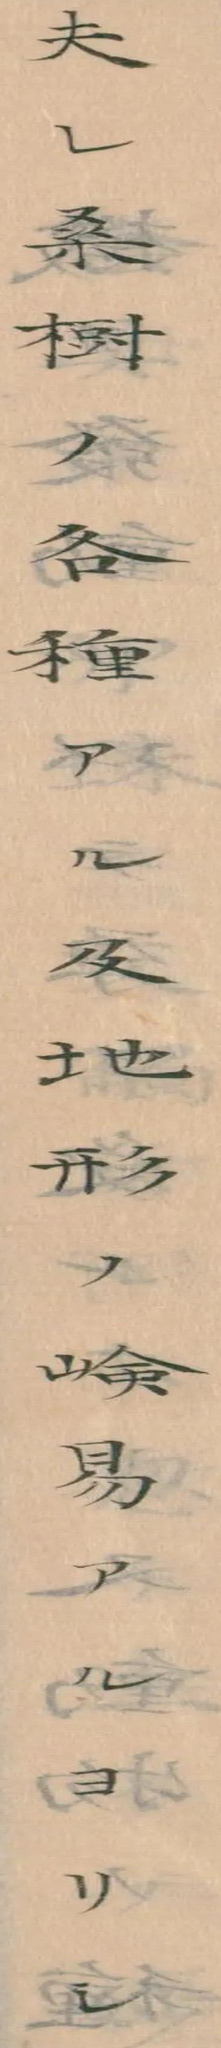夫レ桑樹ノ各種アル及地形ノ𡸴易アルヨリシ
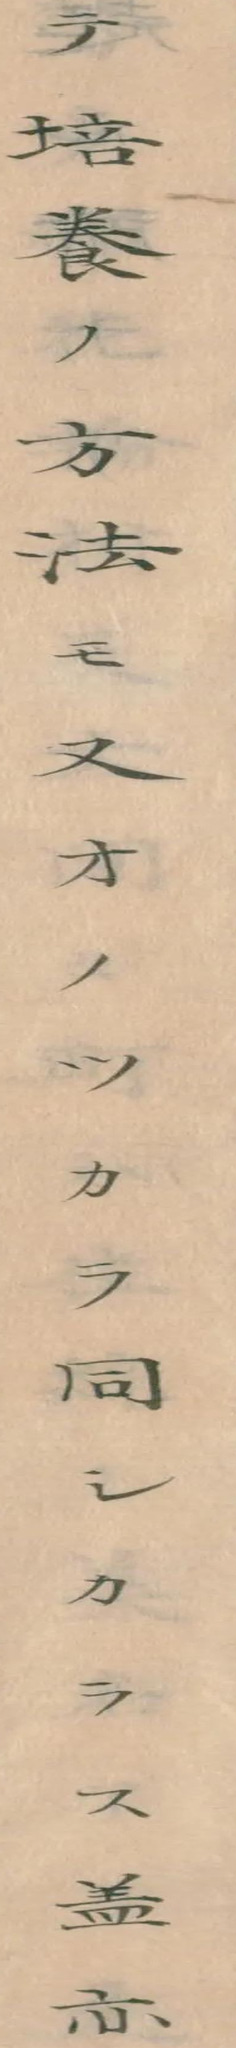テ培養ノ方法モ又オノツカラ同シカラス蓋亦
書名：蚕桑集成
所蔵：国立国会図書館 National Diet Library, JAPAN
